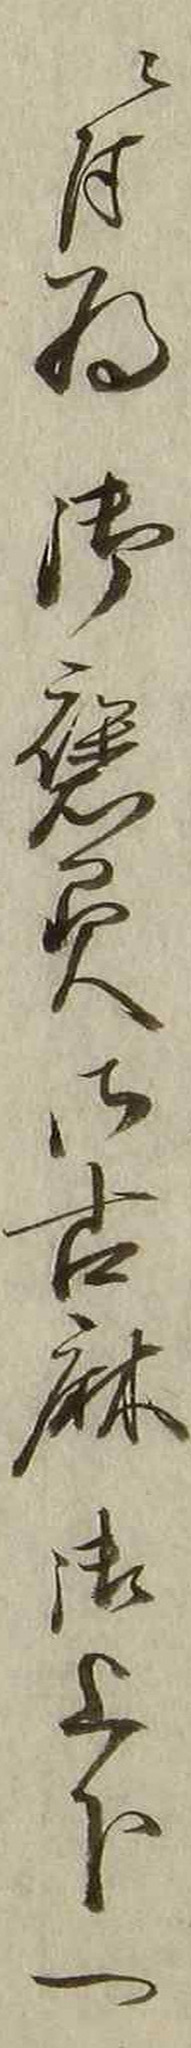に付為御褒美御古麻御上下一
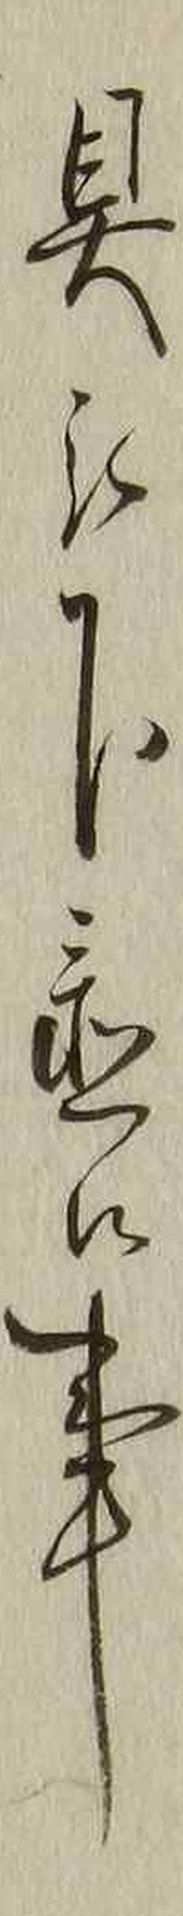具被下置候事
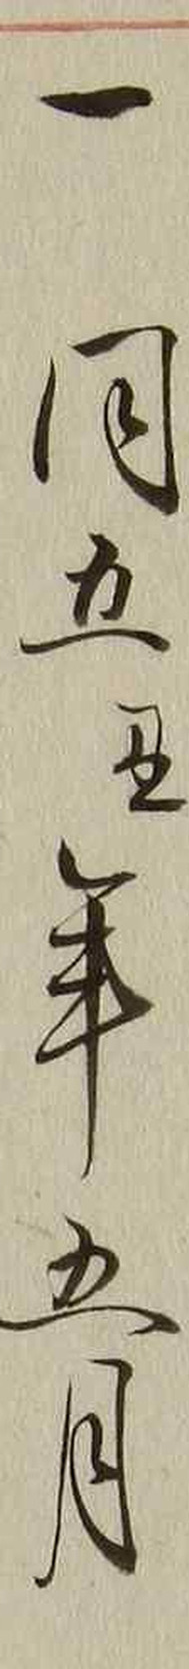一同丑年五月
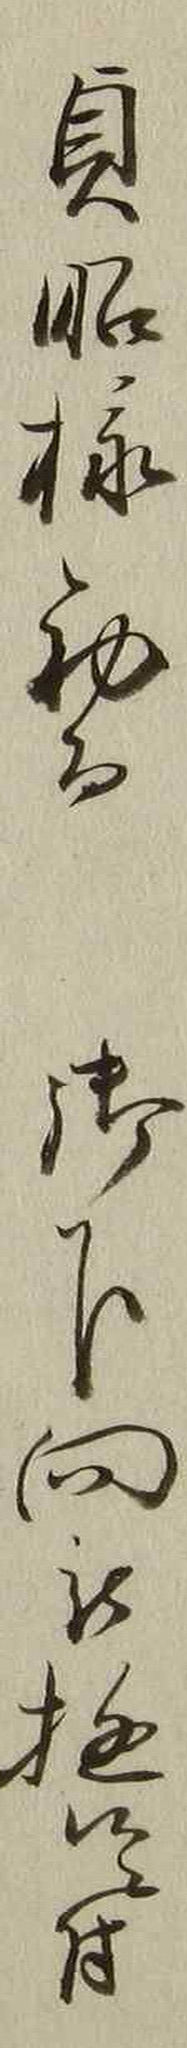貞昭様初而御下向被遊候に付
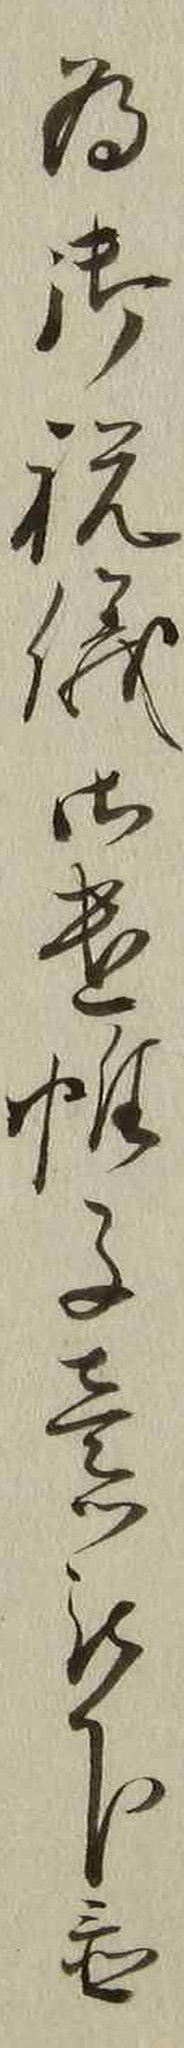為御祝儀御継帷子壱つ被下置
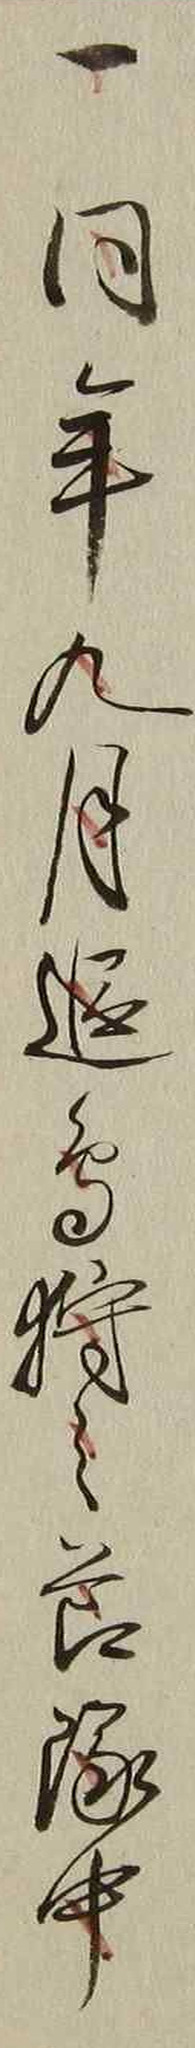一同年九月追鳥狩之節隊中召
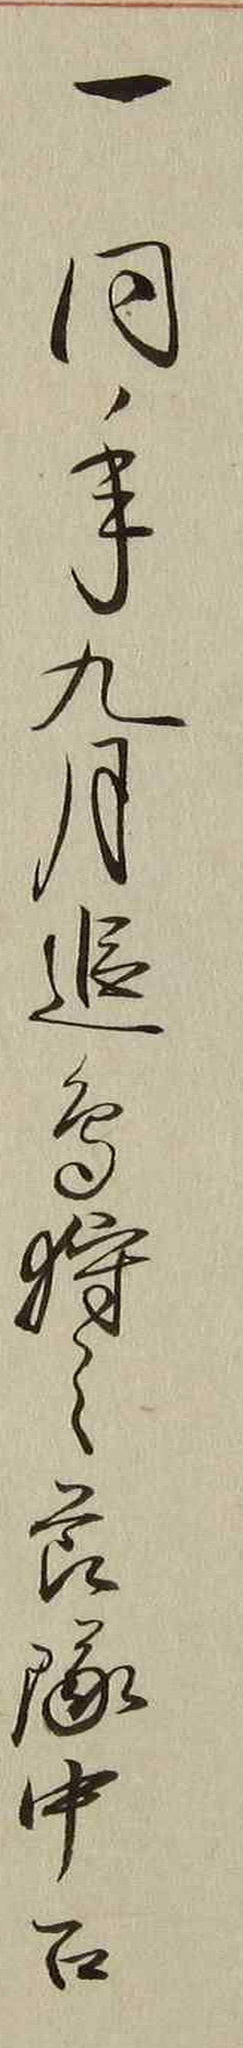一同年九月追鳥狩之節隊中召
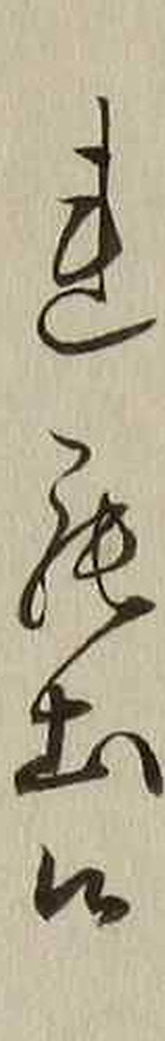連罷出候
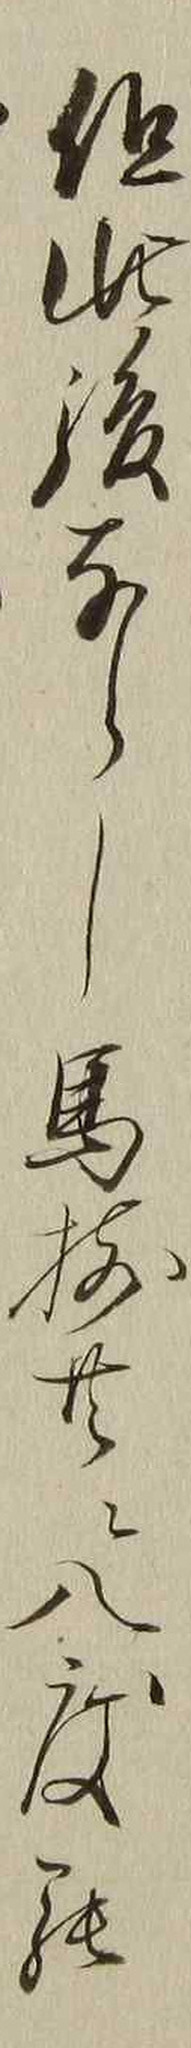但此後ならし馬揃共に八度罷
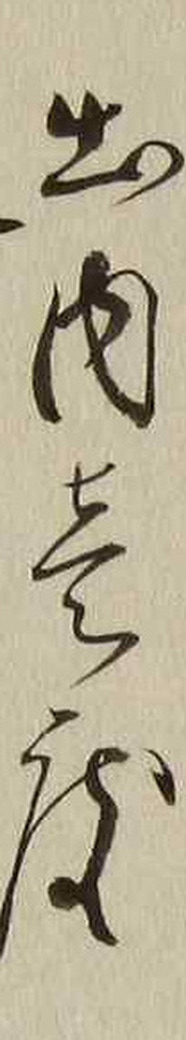出内壱度
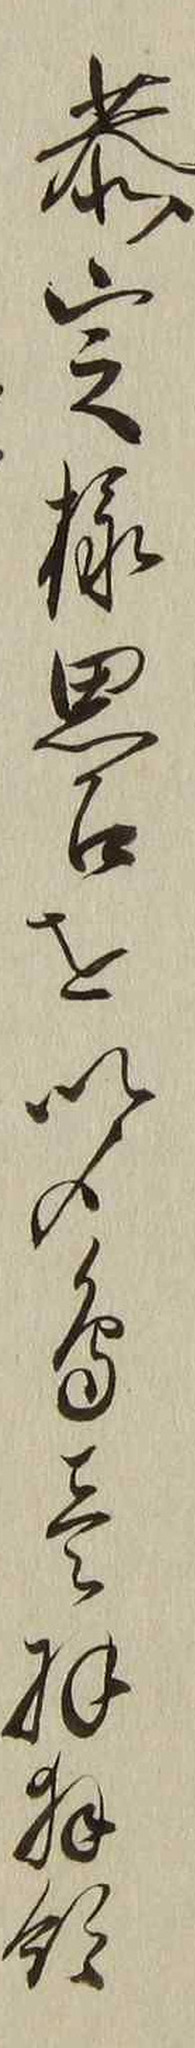恭定様思召を以〆鳥壱羽拝領
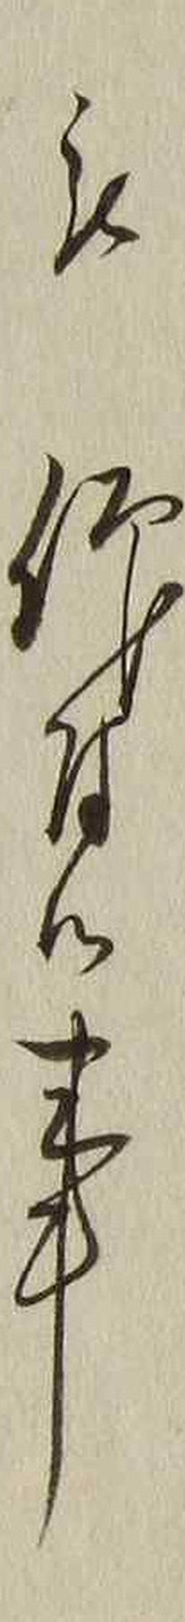被仰付候事
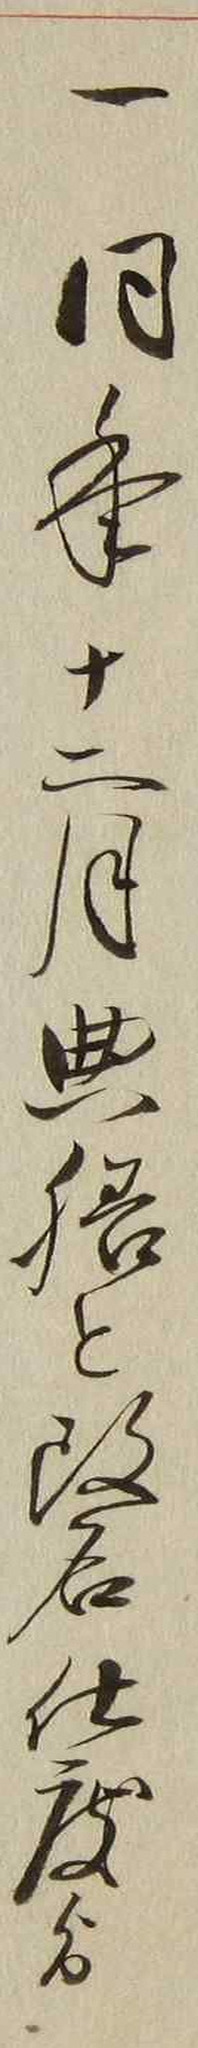一同年十二月典膳と改名仕度旨
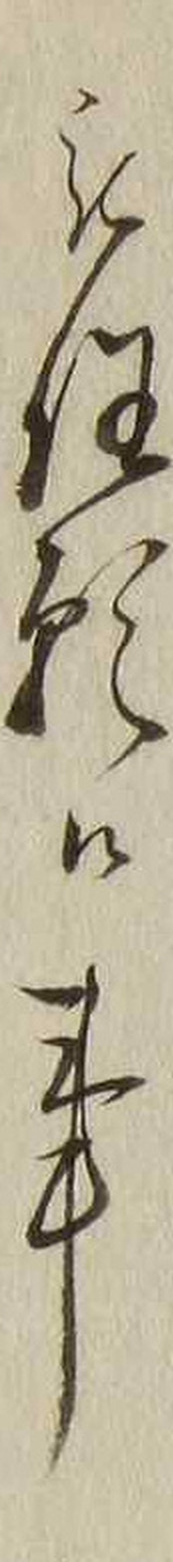被任願候事
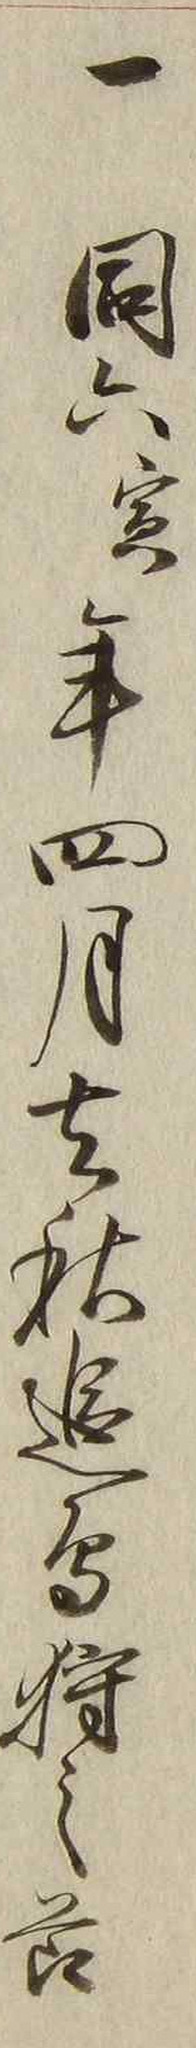一同六寅年四月去秋追鳥狩之節
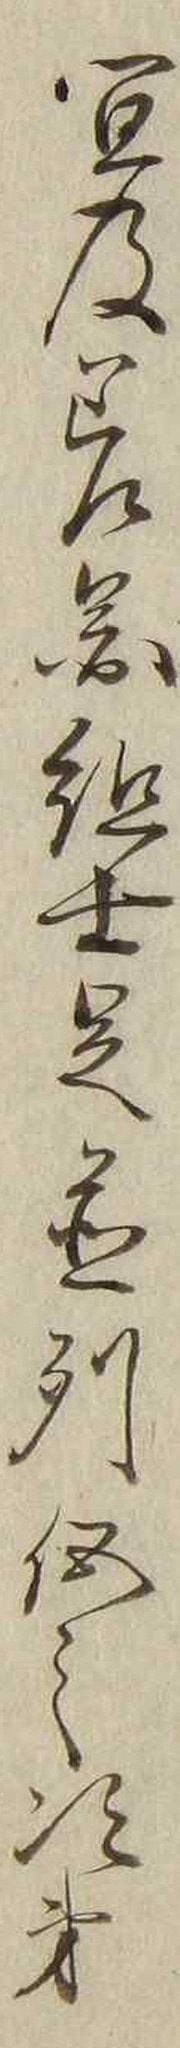宜及差図組士足並列伍之次第
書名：諸士系譜　巻之103　か之部11
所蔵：会津若松市立会津図書館
